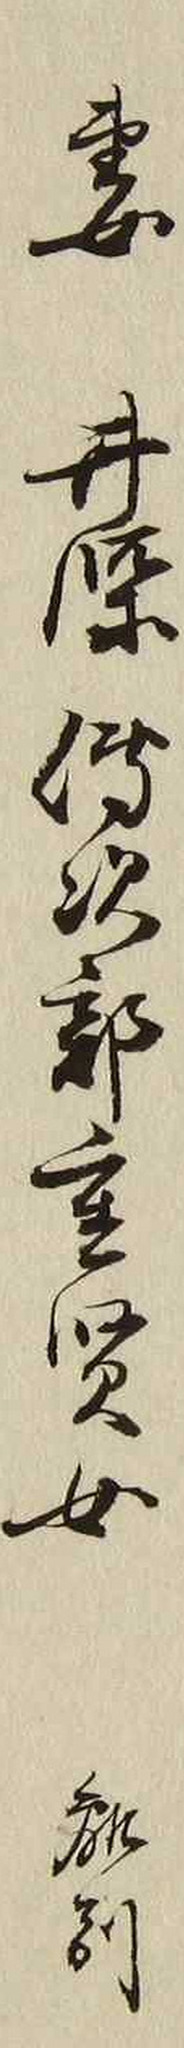妻井深伝次郎重賢女離別
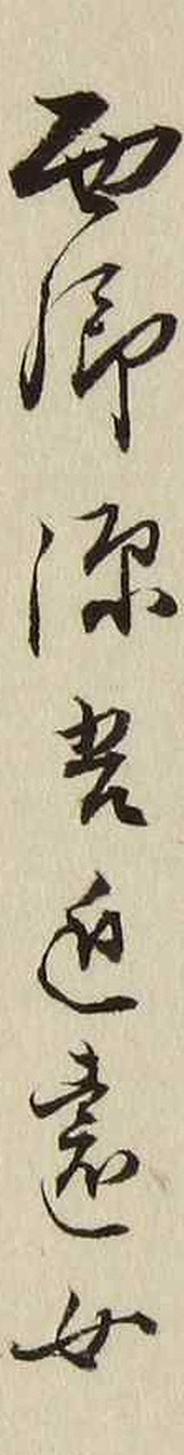西郷源吾近遠女
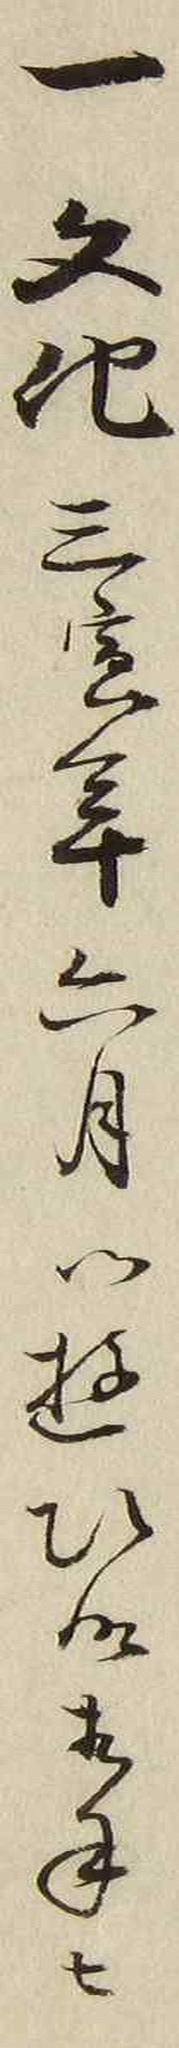一文化三寅年六月御遊ひ御相手被
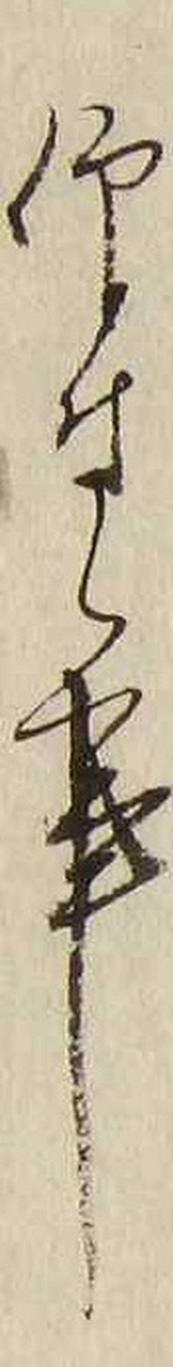仰付候事

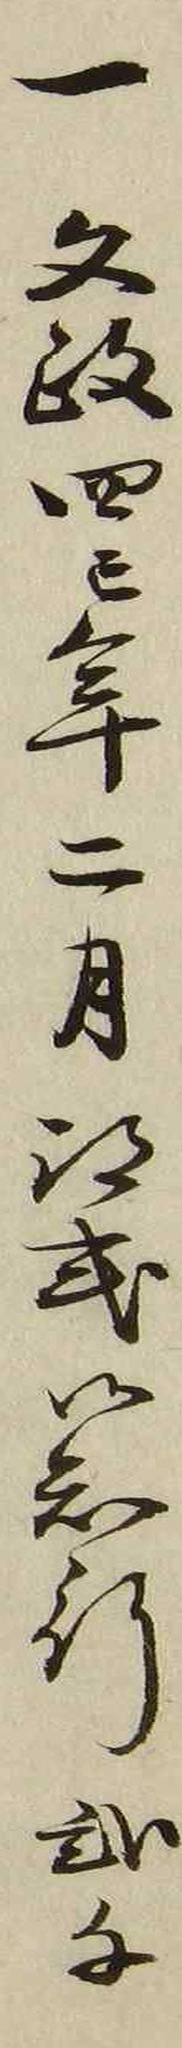一文政四巳年二月跡式御知行弐千
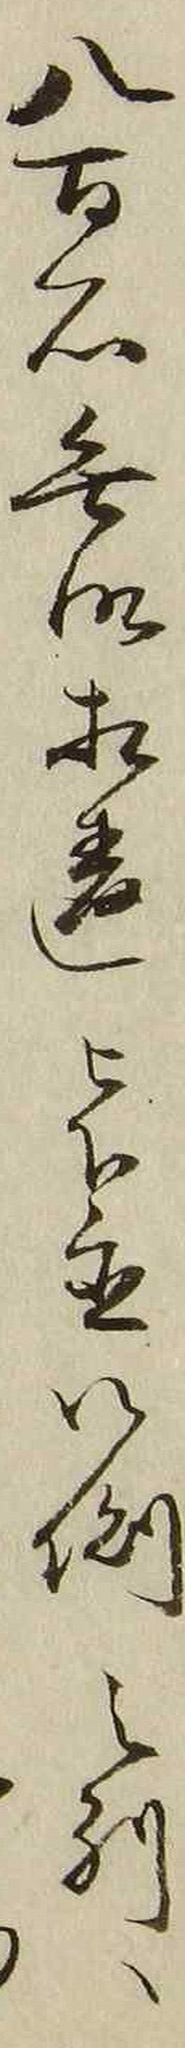八百石無御相違被下置御側之列に
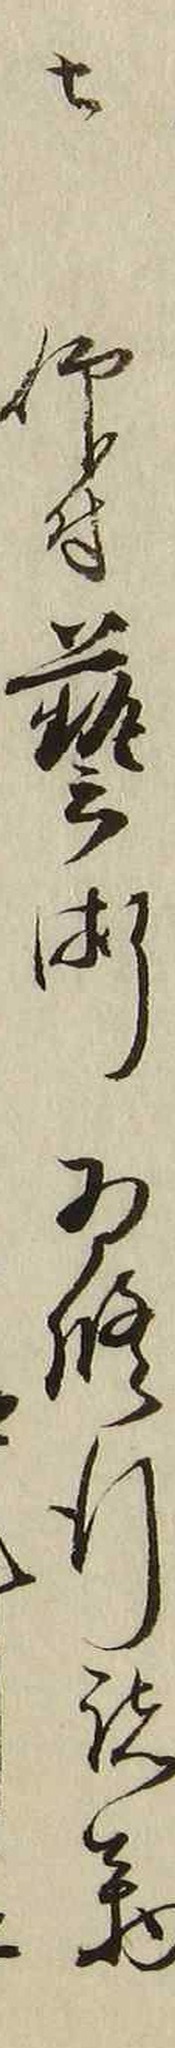被仰付芸術為修行諸勤
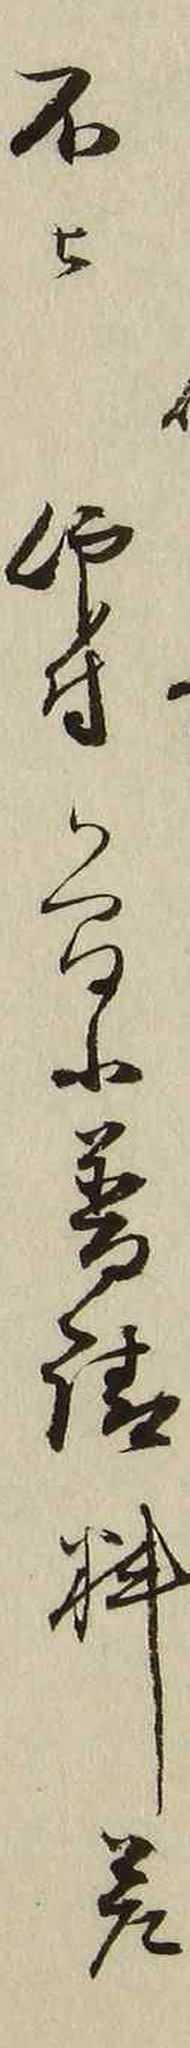不被仰付候間小普請料差
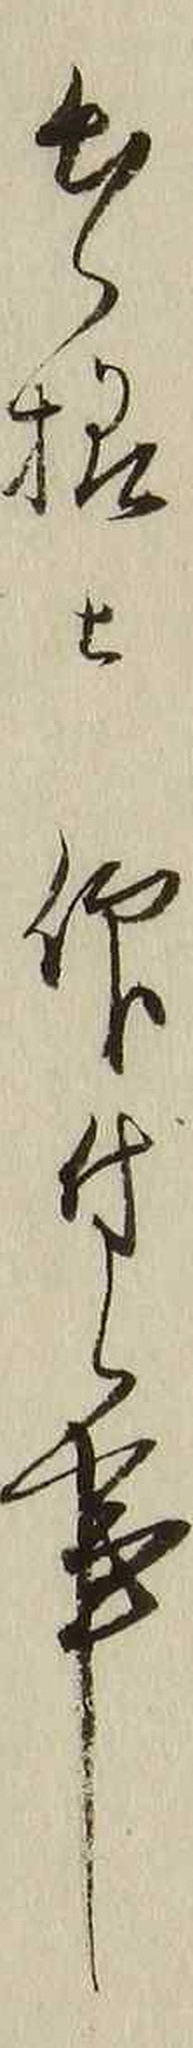出候様被仰付候事
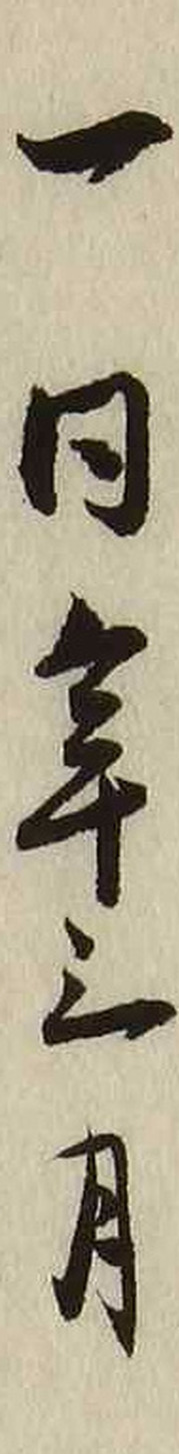一同年三月
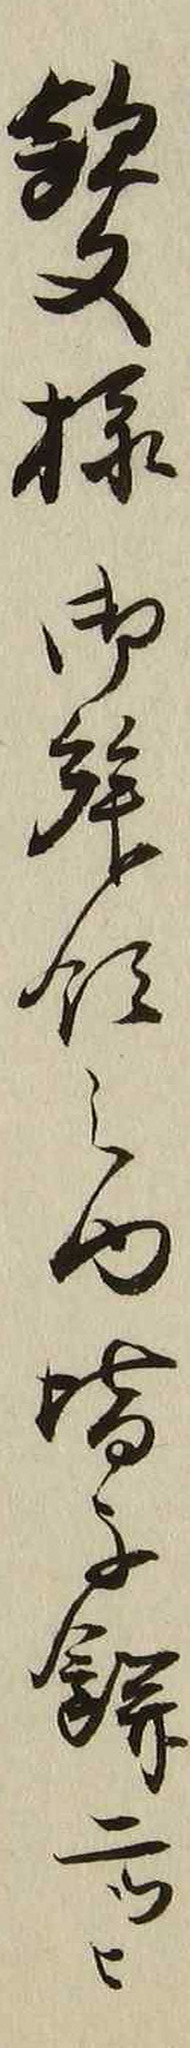欽文様御拝領之内皆子餅二つ被
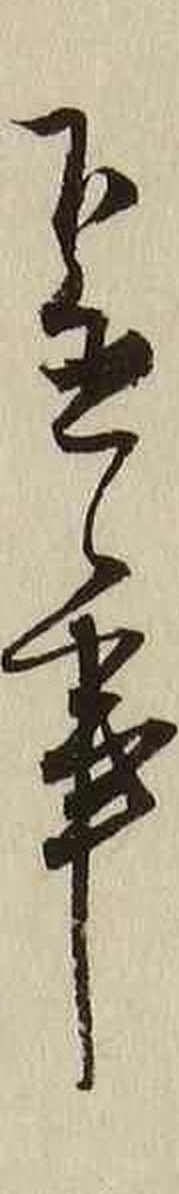下置候事
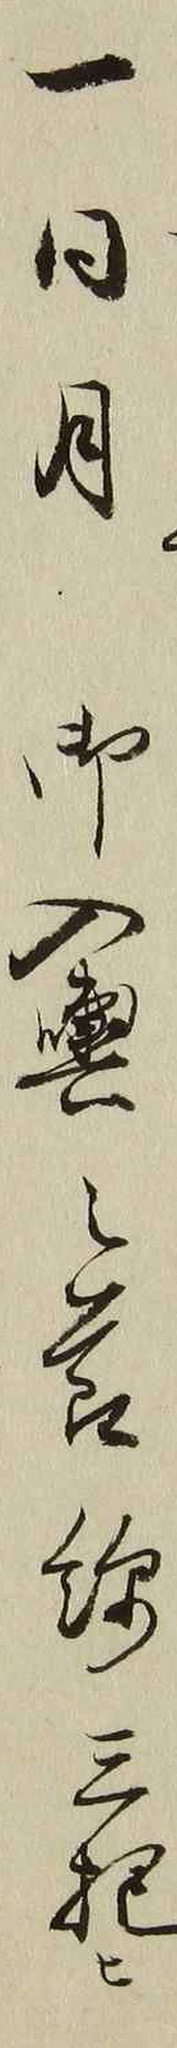一同月御入輿之節綿三把被
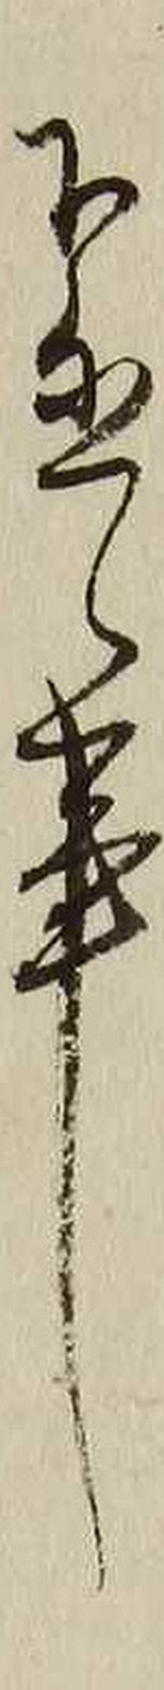下置候事
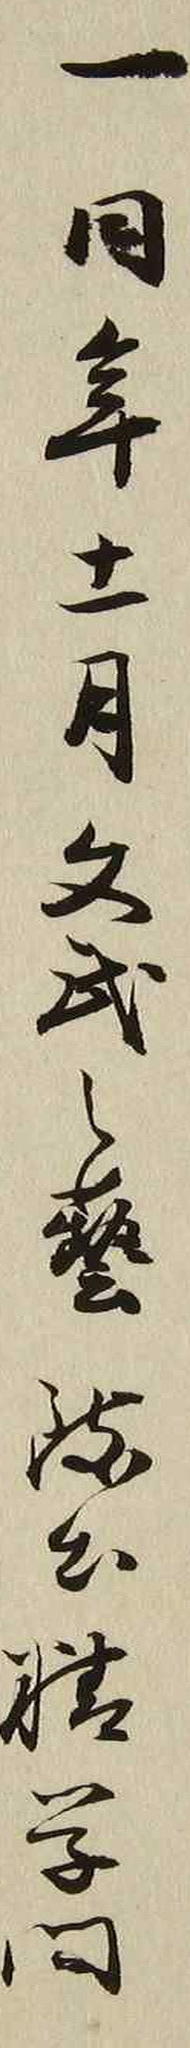一同年十一月文武之芸致出精学問
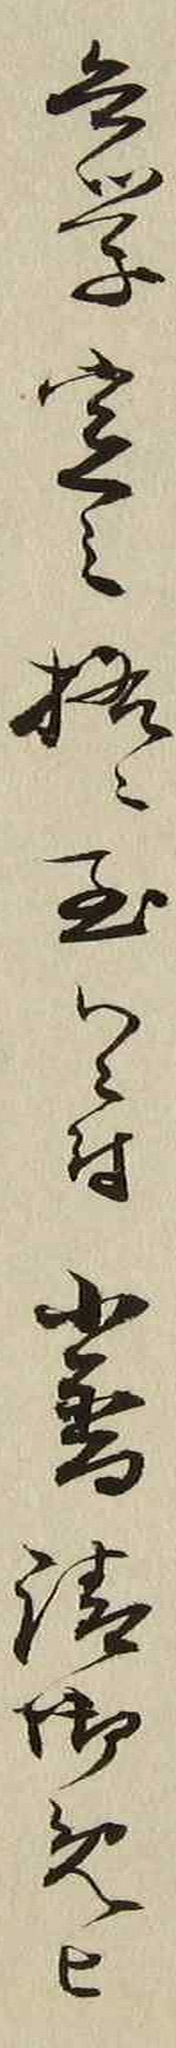兵学定之格に至候に付小普請御免被
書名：諸士系譜　巻之292　き之部1
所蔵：会津若松市立会津図書館
